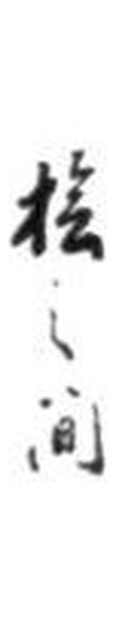檜之間
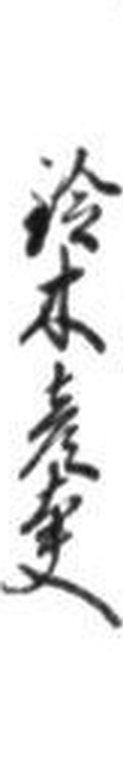鈴木彦太夫
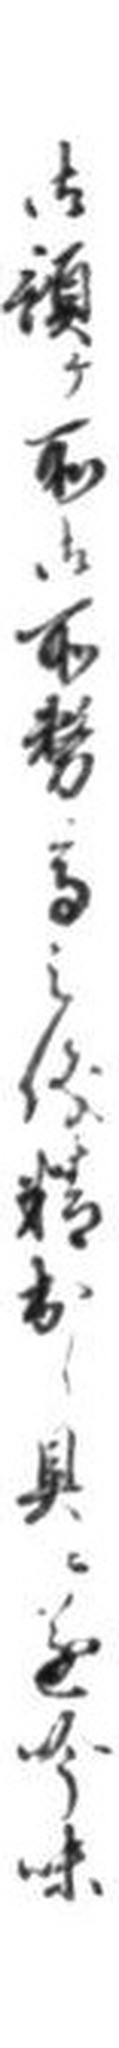御預ケ所御所務高之儀精出し具ニ遂吟味
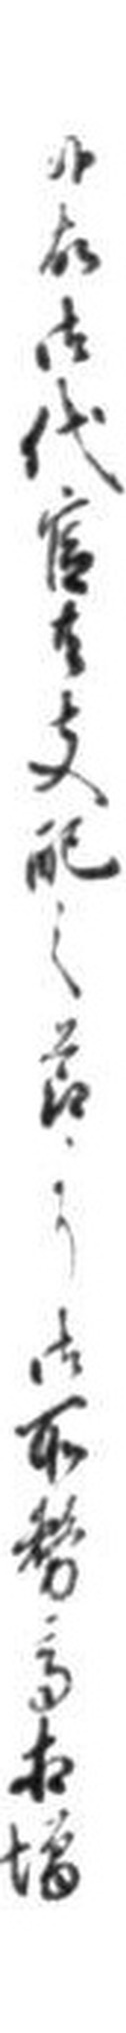候故御代官共支配之節より御所務高相増
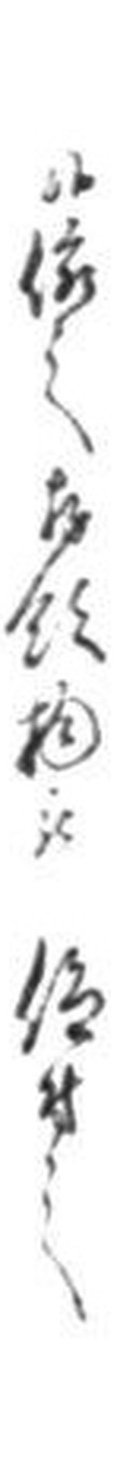候依之拝領物被仰付之
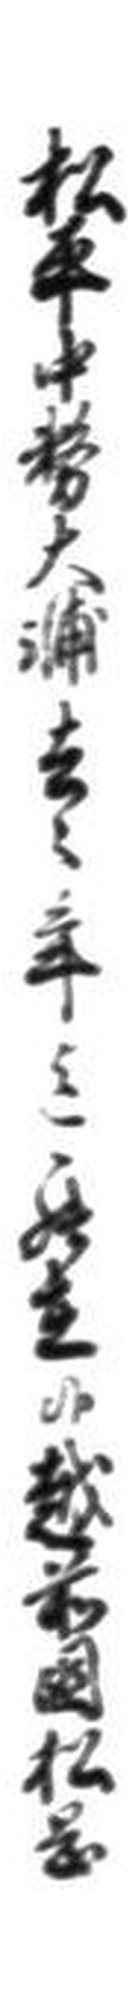松平中務大輔去々年迄罷在候越前国松岡
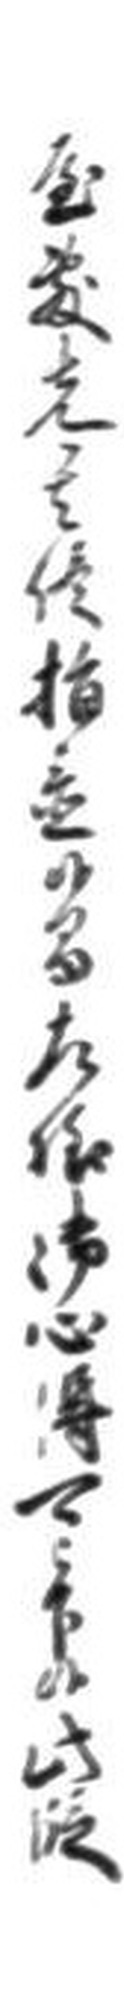屋敷先其儘指置候間左様御心得可被下候此段
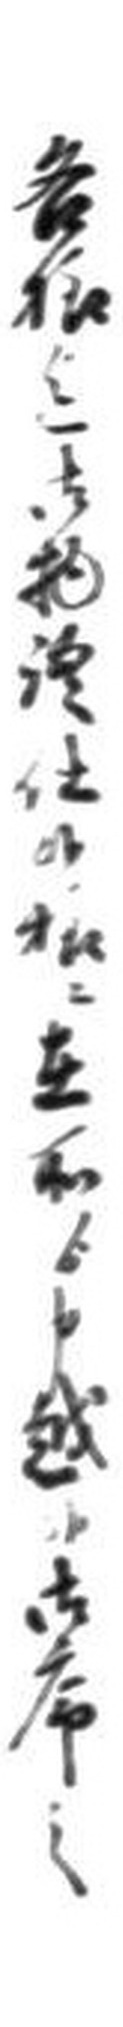各様迄御物語仕候様ニ在所ゟ申越候御序之
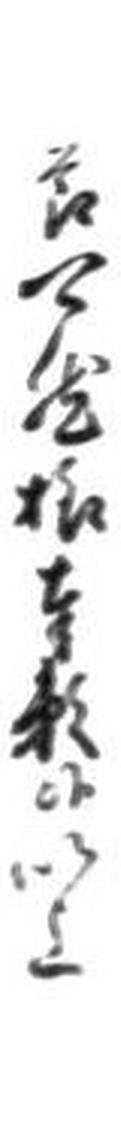節可然様奉頼候以上
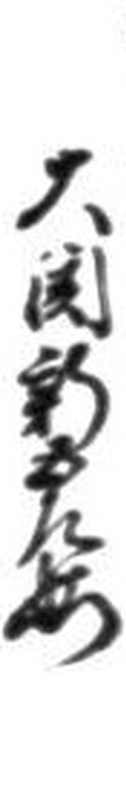大関新五左衛門
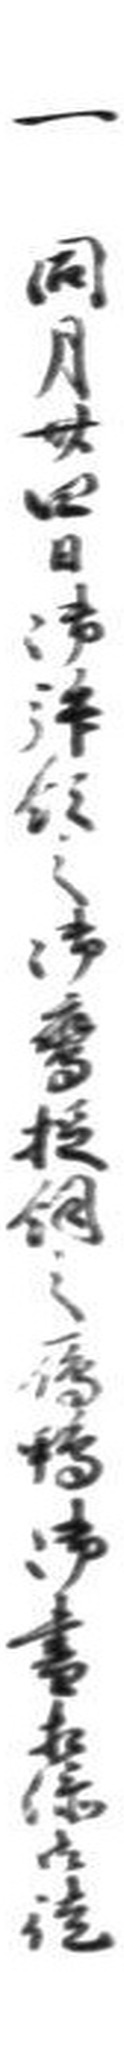一同月廿四日御拝領之御鷹授飼之鳫鴨御書相添御徒

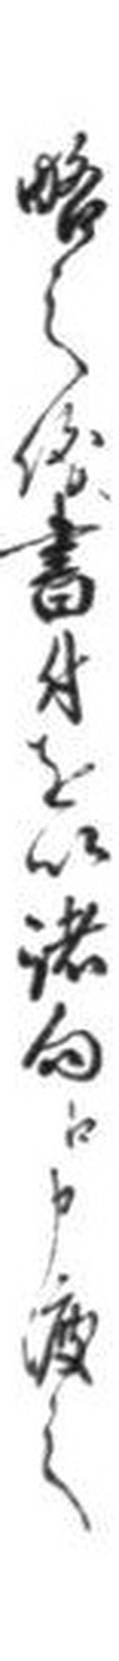略之儀書付を以諸向江申渡之
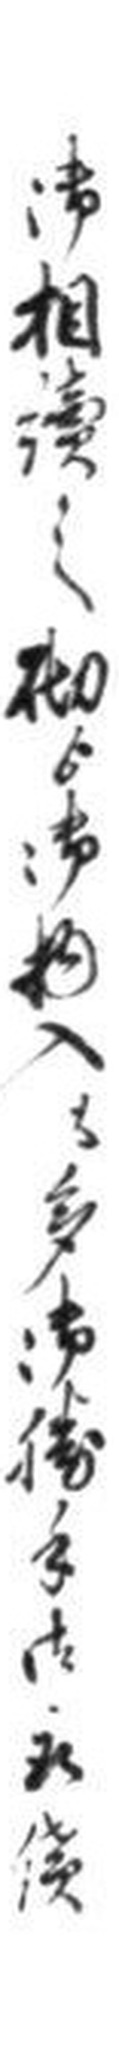御相続之砌ゟ御物入も多御勝手御取続
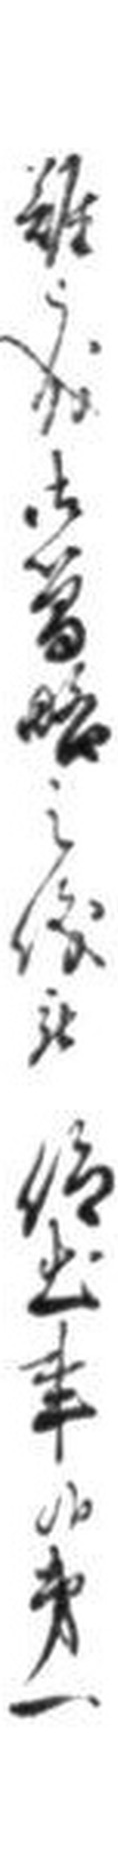難被成御簡略之儀被仰出事候第一
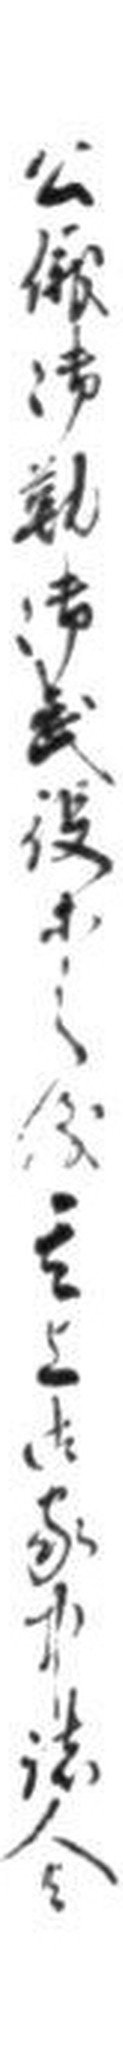公儀御勤御武役等之儀其上御家中諸人者
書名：家譜 三十六 宗昌公 従享保八年到同九年
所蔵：福井県文書館 Fukui Prefectural Archives
